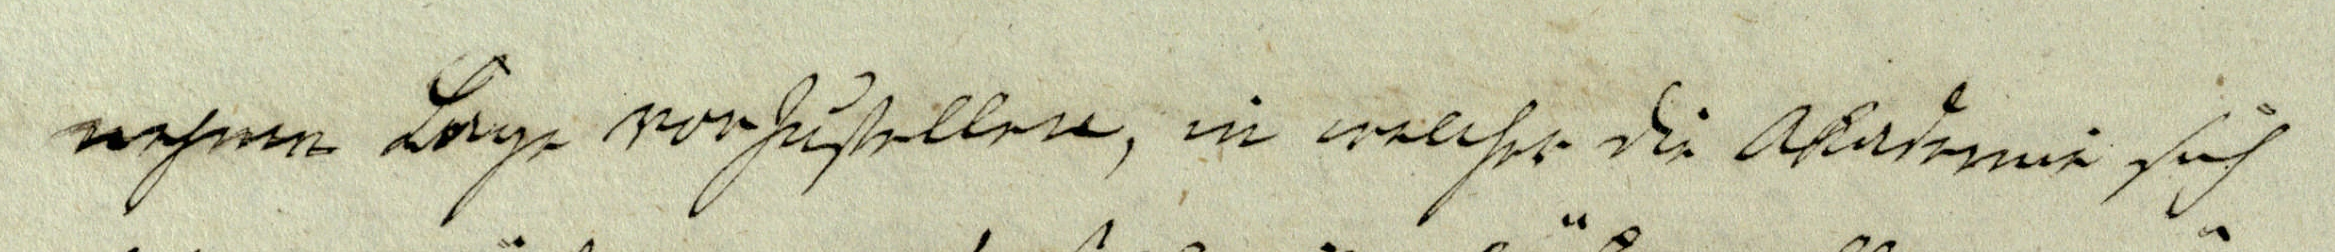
nehme Lage vorzustellen, in welcher die Akademie sich
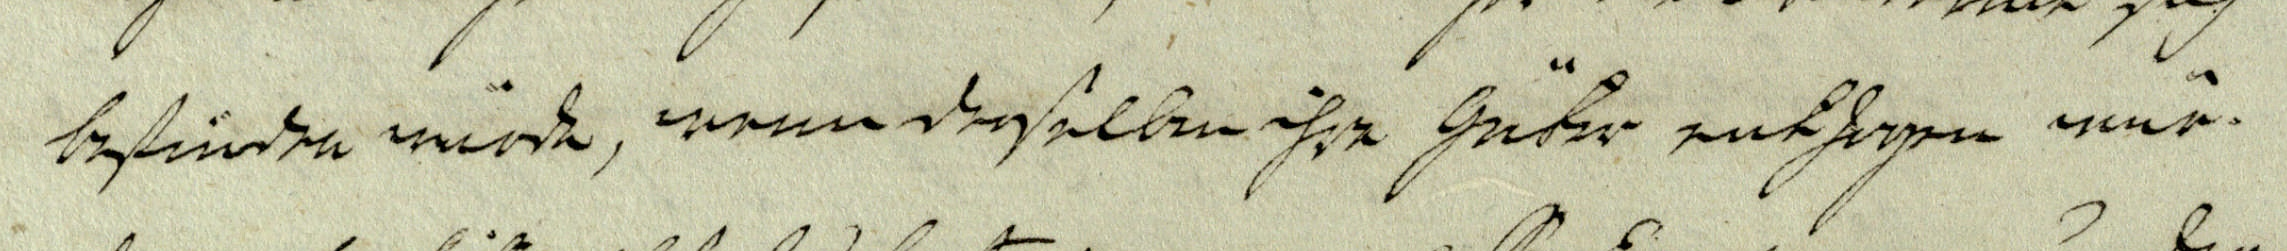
befinden würde, wenn derselben ihre Güter entzogen wür¬
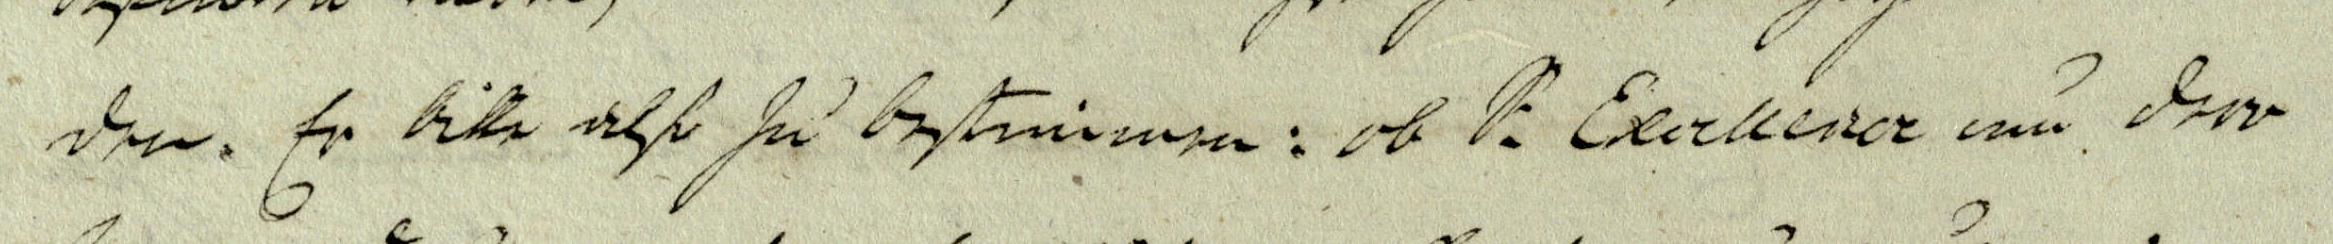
den. Er bitte also zu bestimmen: ob Sr. Excellence um dero
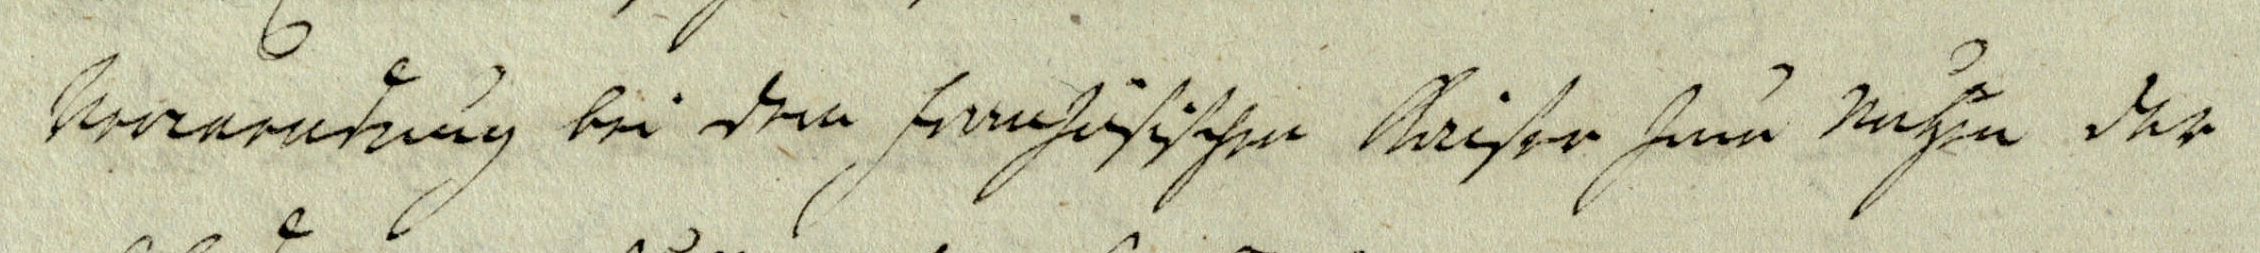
Verwendung bei dem Französischen Kaiser zum Nutzen der
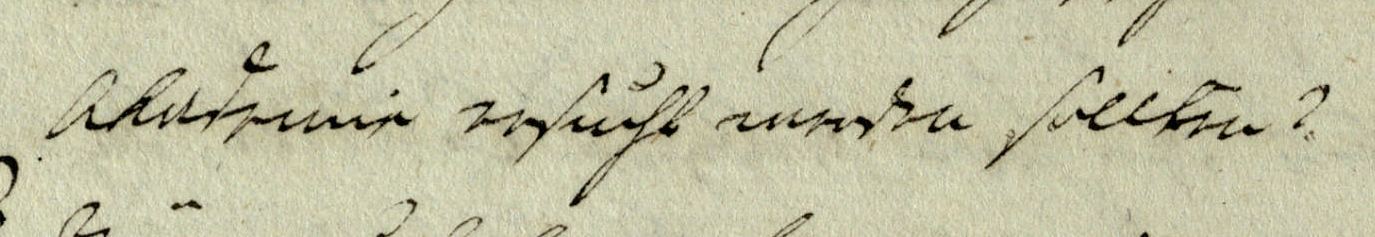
Akademie ersucht werden sollten?
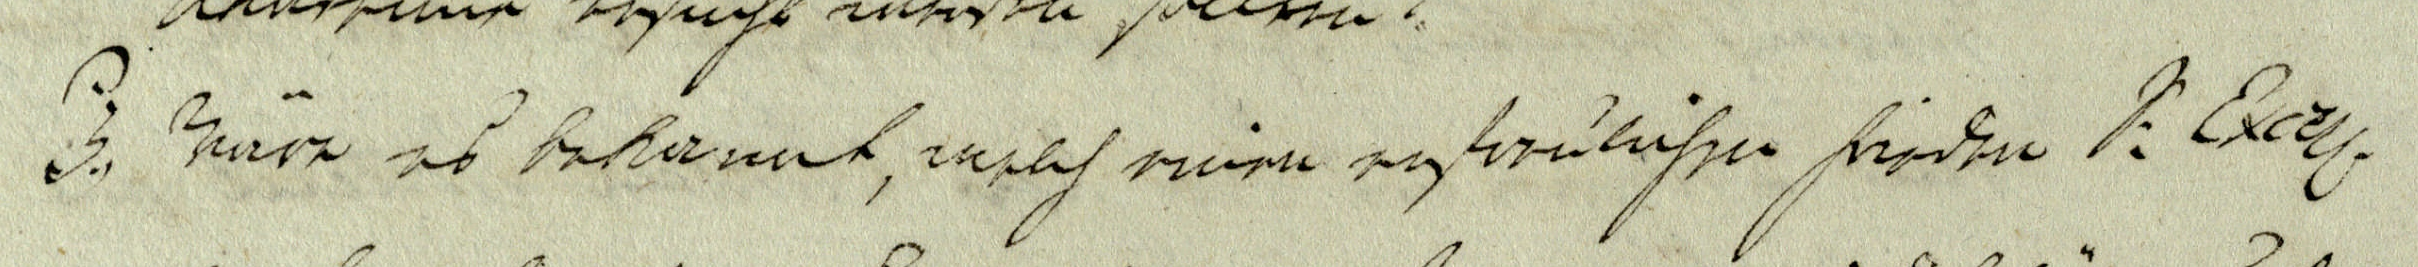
3. Wäre es bekannt, welch einen erfreulichen Frieden Sr. Excll.
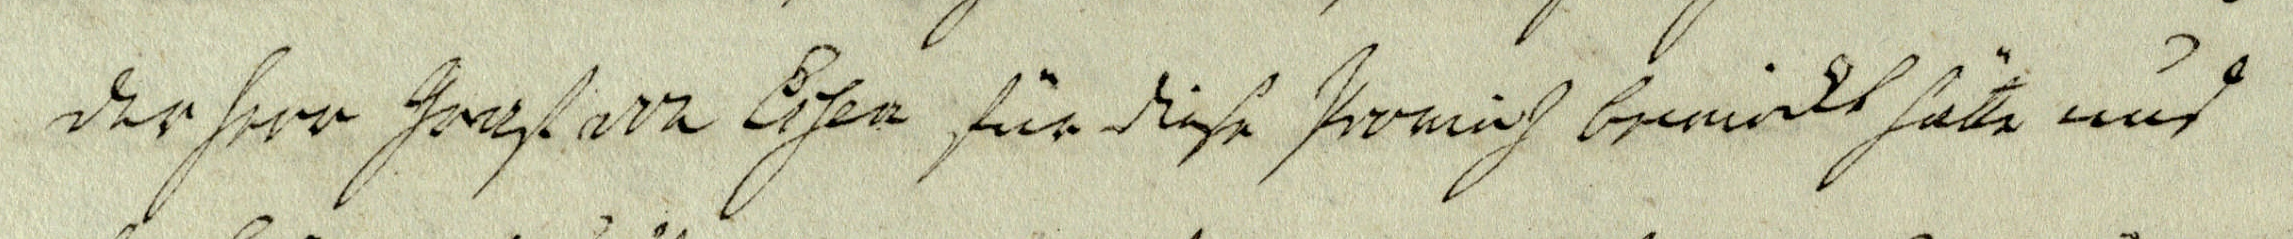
der Herr Graf von Essen für diese Provinz bewirkt hätte und
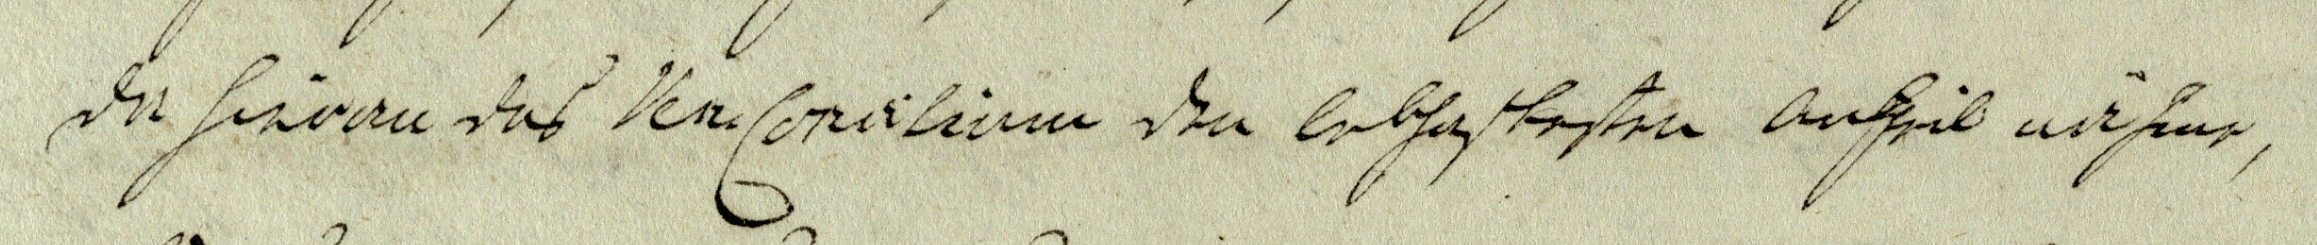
da hieran das Ven. Concilium den lebhaftesten Antheil nähme,
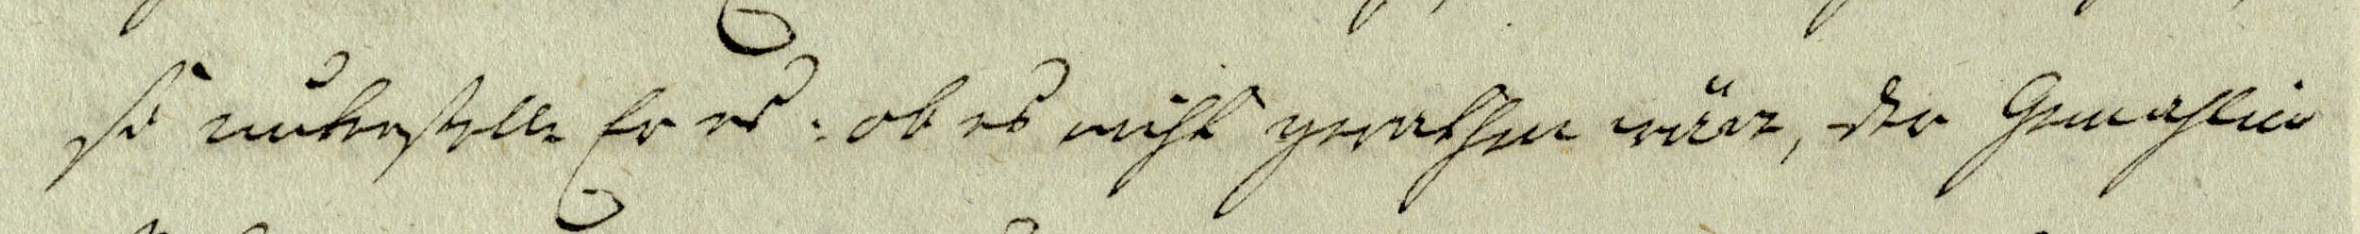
so unterstelle Er es ob es nicht gerathen wäre, der Gemahlin
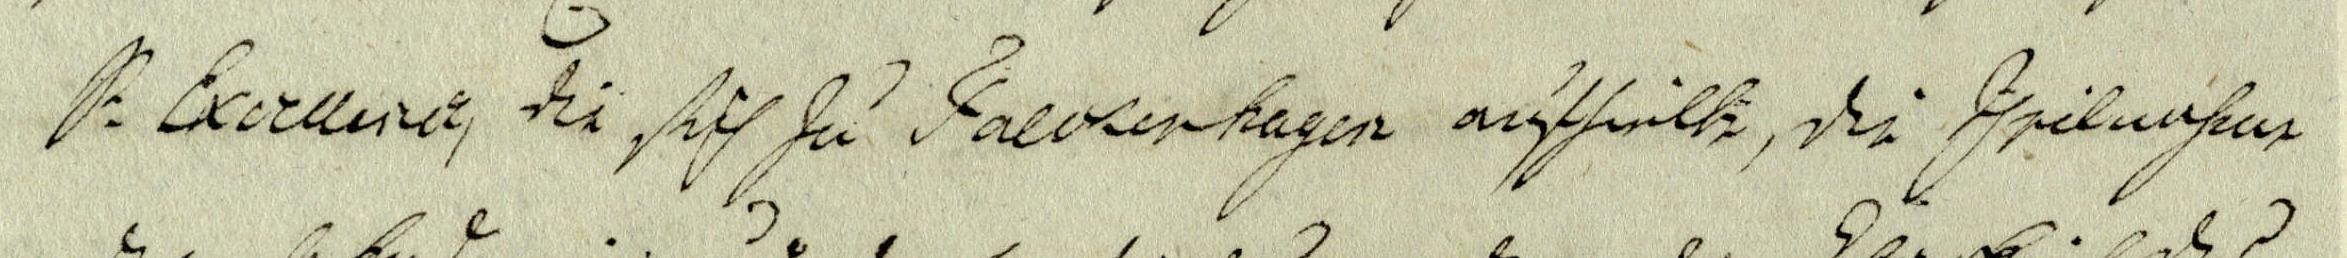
Sr Excellence, die sich zu Falckenhagen aufhielte, die Theilnahme
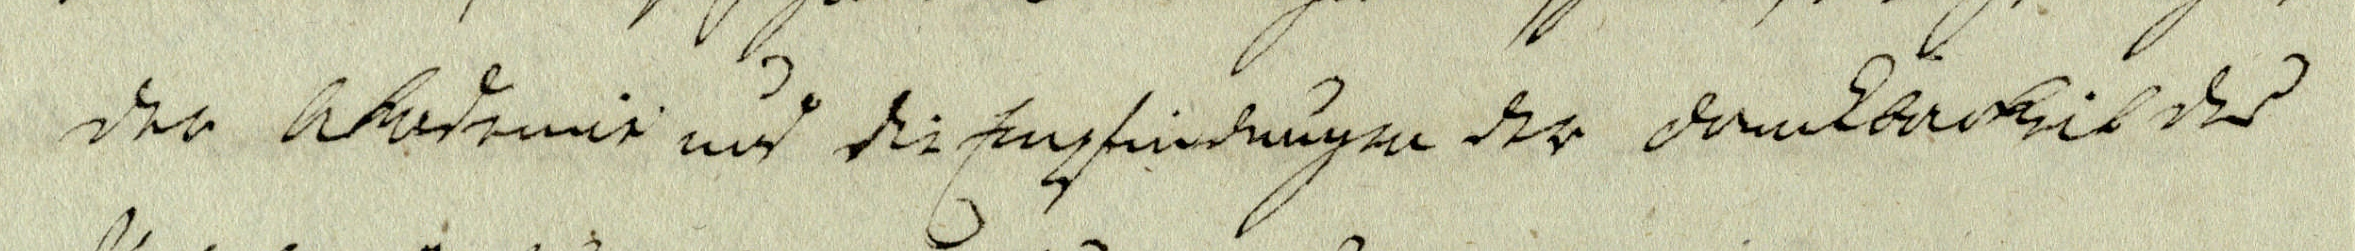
der Akademie und die Empfindungen der Dankbarkeit des
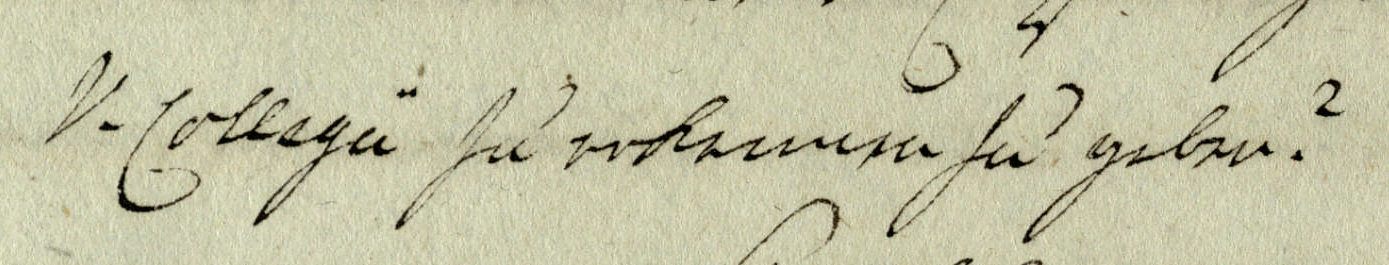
V. Collegii zu erkennen zu geben?
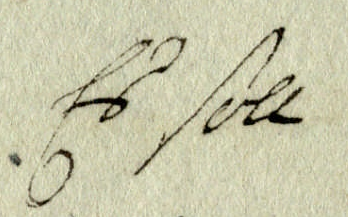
Es soll
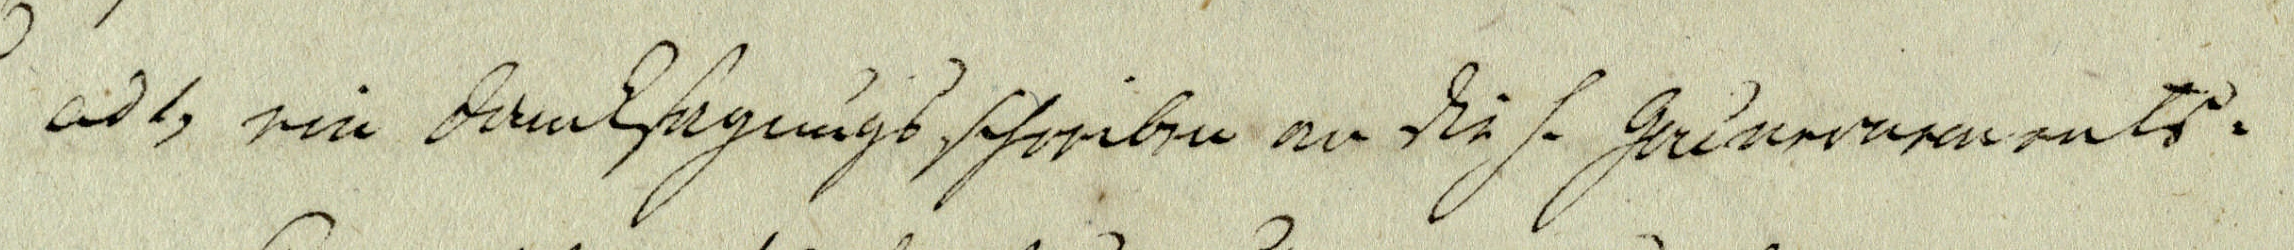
ad 1, ein Danksagungsschreiben an die h. Gouvernements¬
